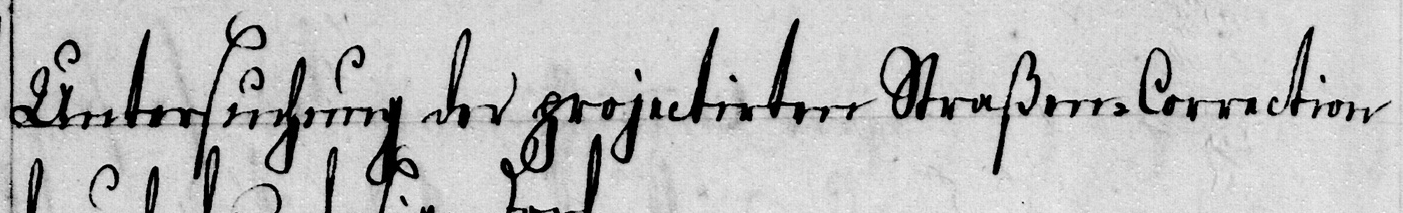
Untersuchung der projectirten Straßen-Correction
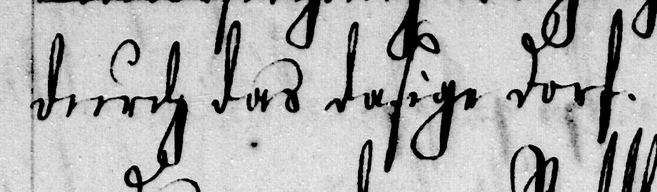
durch das dasige Dorf.
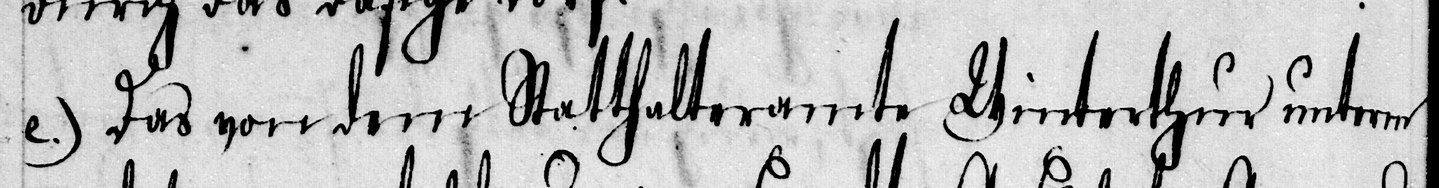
e.) Das von dem Statthalteramte Winterthur unterm
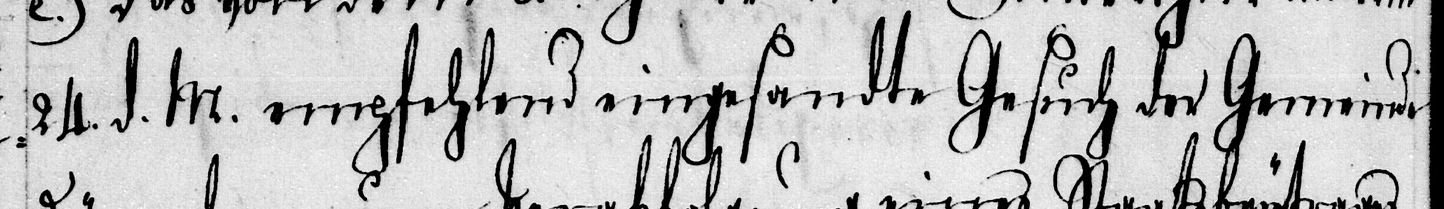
24. d. M. empfehlend eingesandte Gesuch der Gemeinde
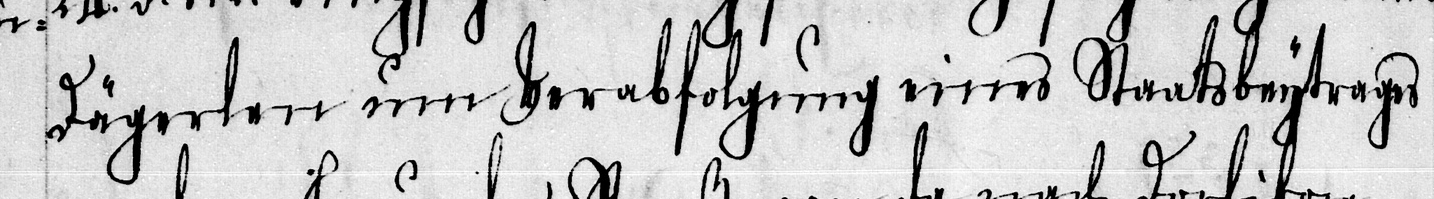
Dägerlen um Verabfolgung eines Staatsbeytrages
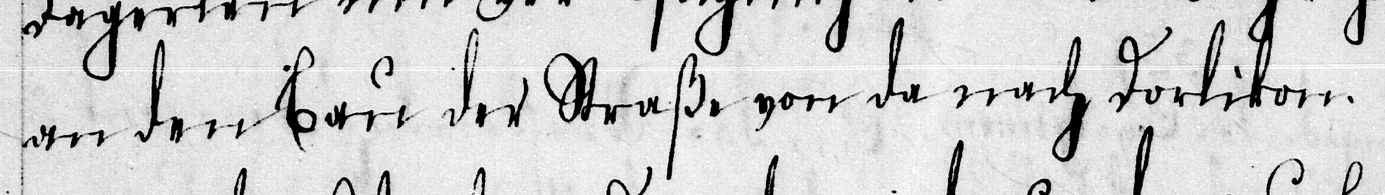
an den Bau der Straße von da nach Dorlikon.
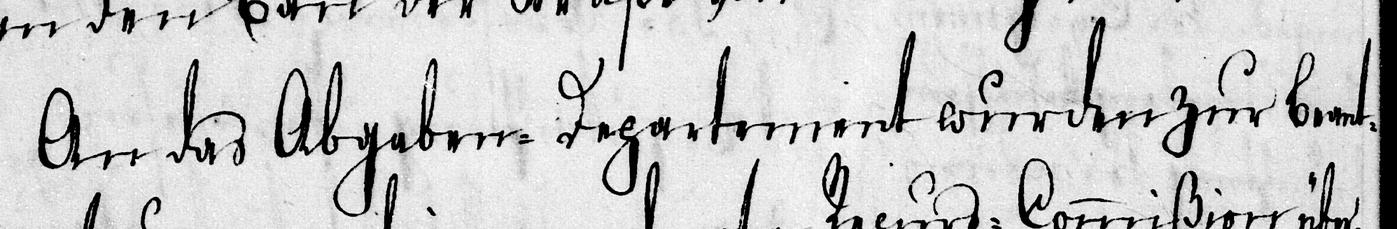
An das Abgaben-Departement wurden zur Bean¬
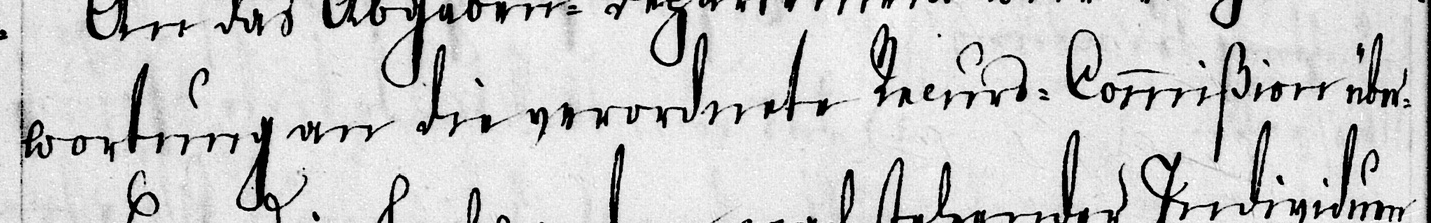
twortung an die verordnete Recurs-Commißion übe¬
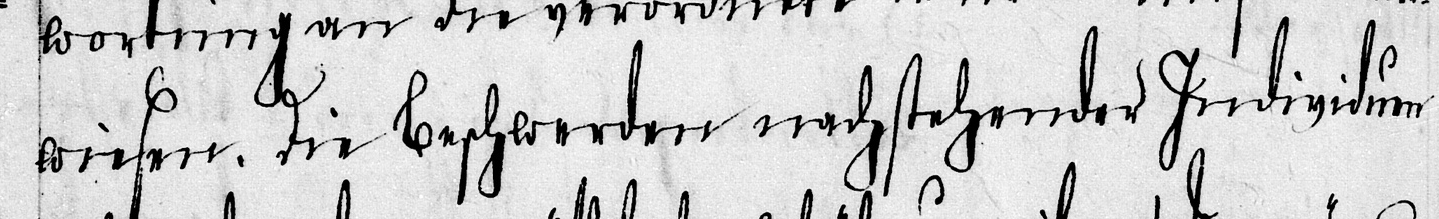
rwiesen. Die Beschwerden nachstehender Individuen
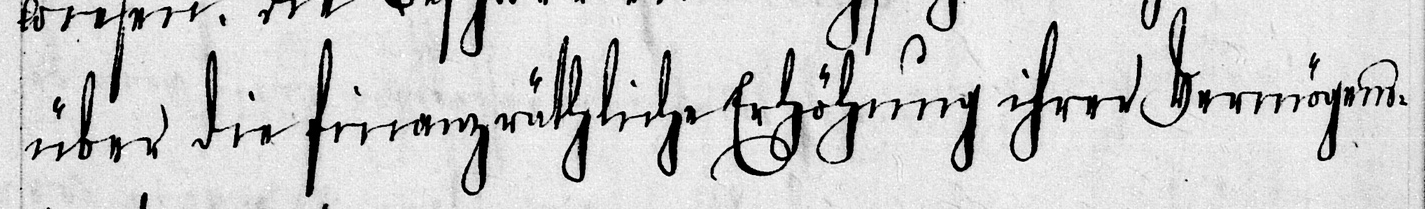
über die finanzräthliche Erhöhung ihrer Vermögens¬
